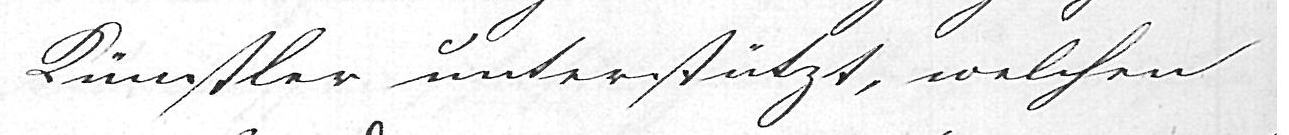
Künstler unterstützt, welchen
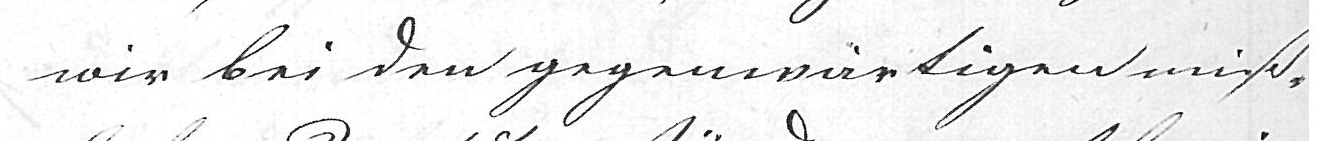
wir bei den gegenwärtigen miß-
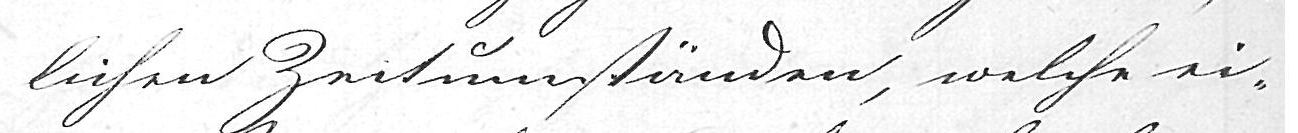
lichen Zeitumständen, welche ei-
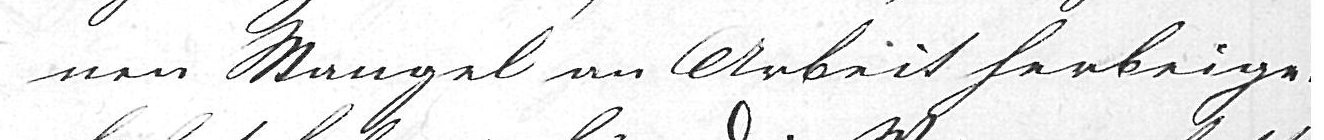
nen Mangel an Arbeit herbeige-
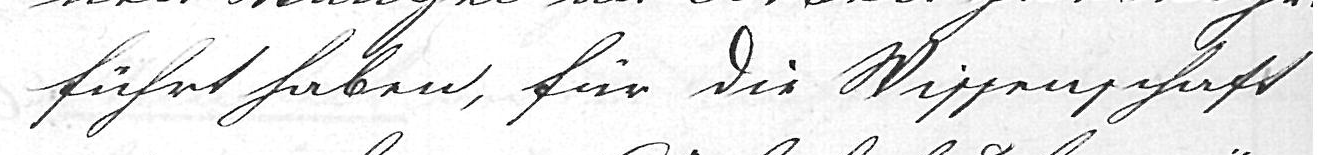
führt haben, für die Wissenschaft
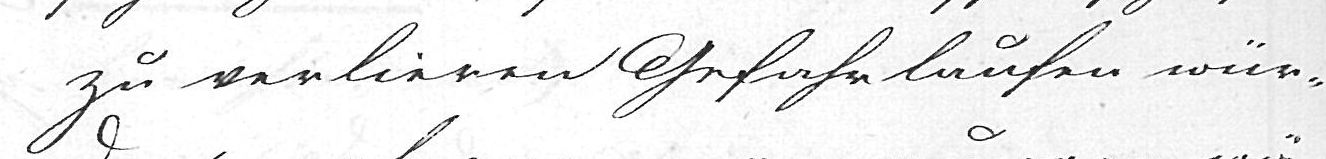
zu verlieren Gefahr laufen wür-
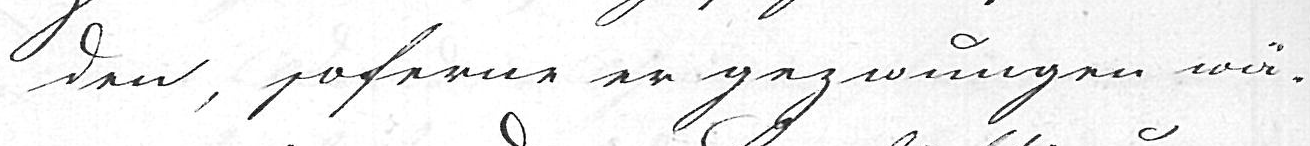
den, soferne er gezwungen wä-
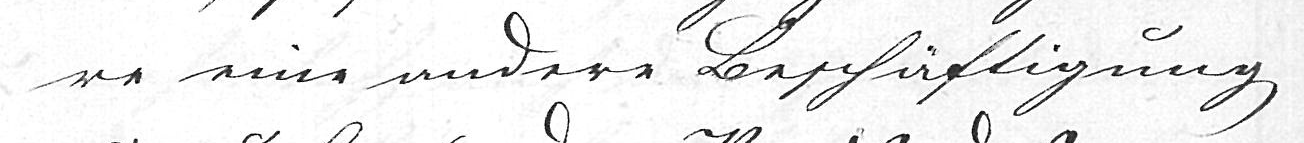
re eine andere Beschäftigung
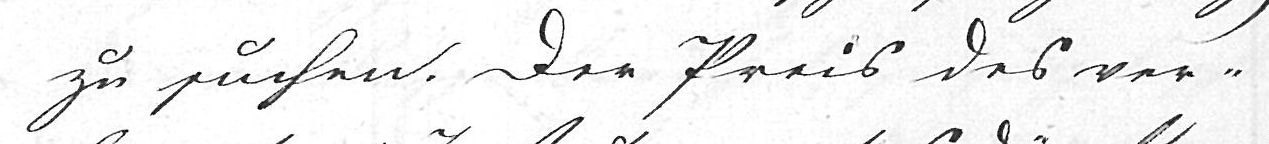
zu suchen. Der Preise des ver-
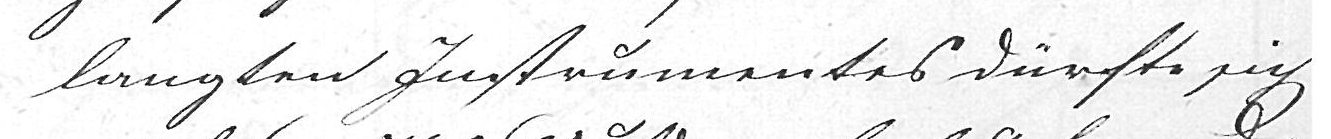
langten Instrumentes dürfte sich
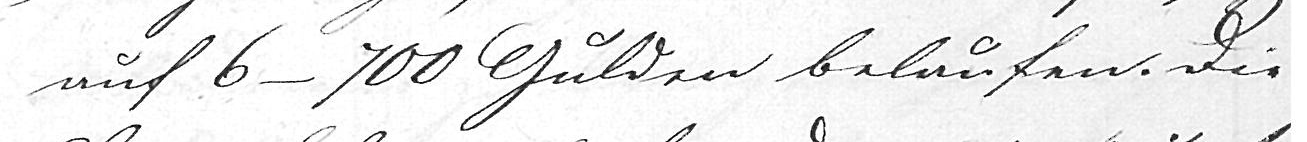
auf 6-700 Gulden belaufen. Die
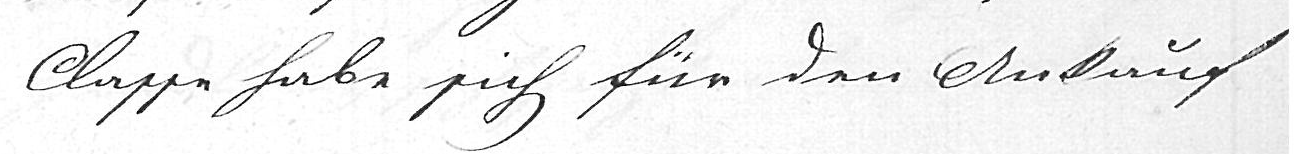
Classe habe sich für den Ankauf
